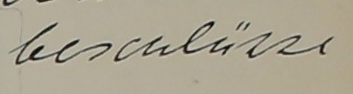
beschlüsse
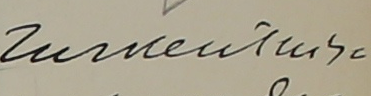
Zurkentnis
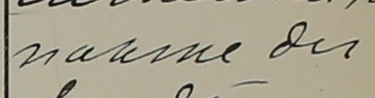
nahme der
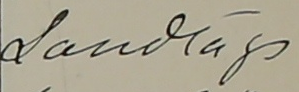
landtags
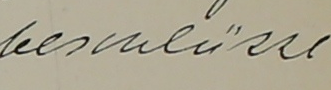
beschlüsse
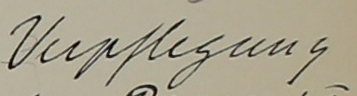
Verpflegung
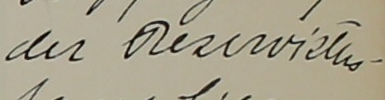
der Reservisten
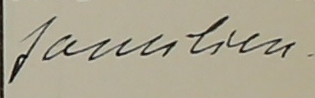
familien
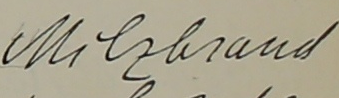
Milzbrand
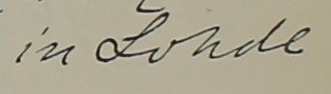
in Lohde
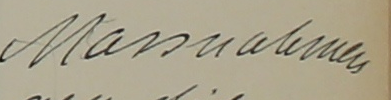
Massnahmen
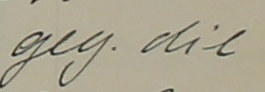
geg. die
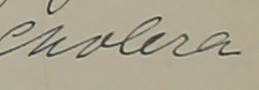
Cholera
